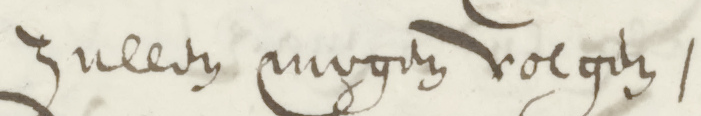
zullen mogen volgen.
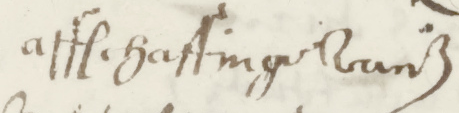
affschaffinge van
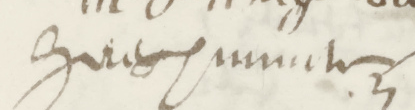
Haegh munte
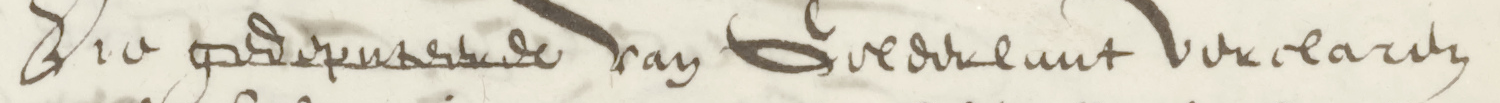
Die gedeputeerde van Gelderlant verclaren
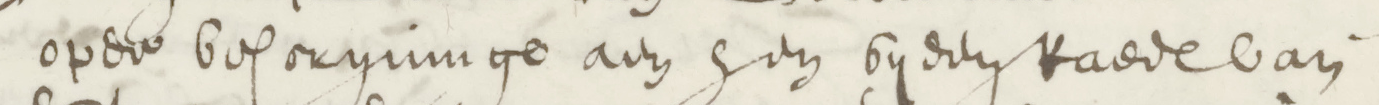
opde bescryvinge aen hen by den Raede van
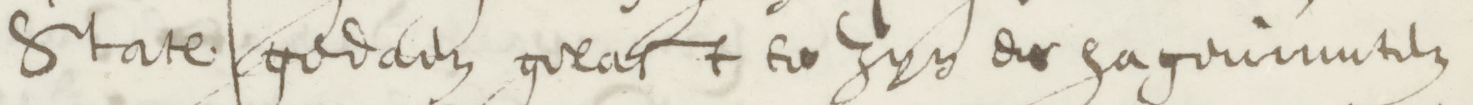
State gedaen, gelast te zijn die Hagenmunten
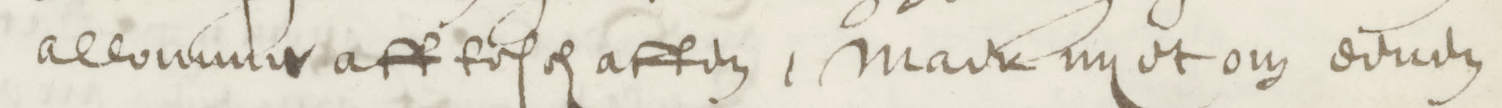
allomme aff te schaffen, maer nyjet om eenen
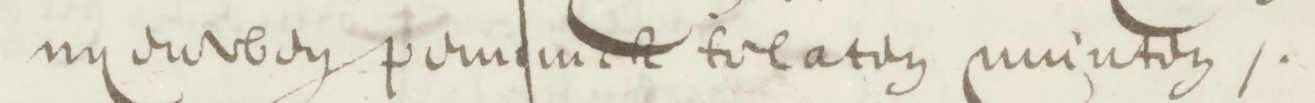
nyewen penninck te laten munten.
